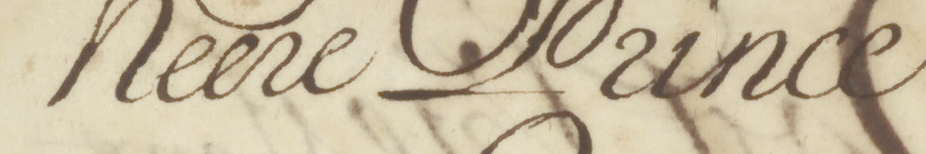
Heere Prince
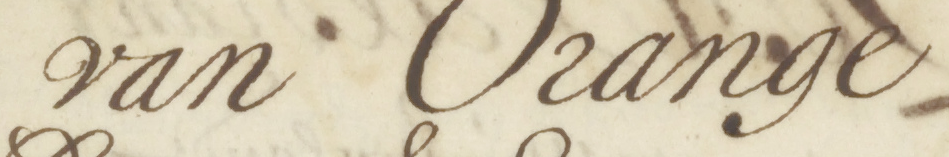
van Orange
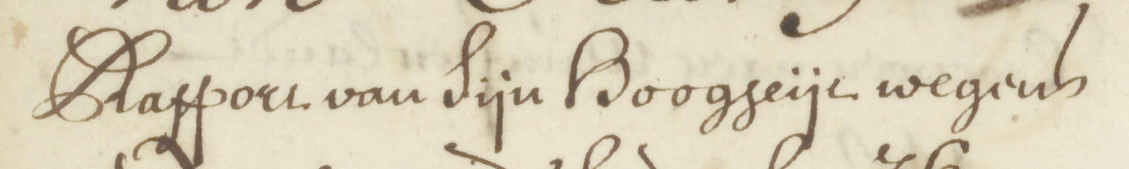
Rapport van Sijn Hoogheijt wegens
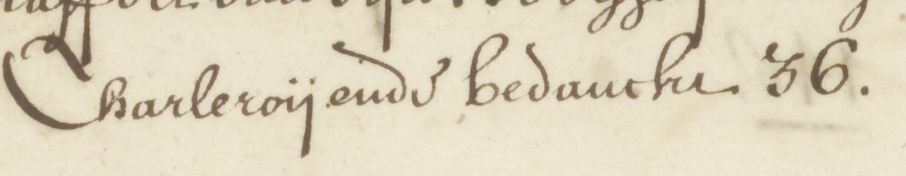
Charleroij ende bedanckt 36.
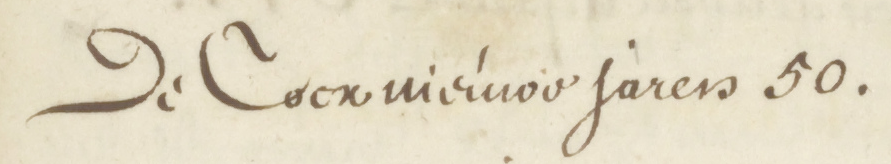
De Cocx nieuwe jaren 50.
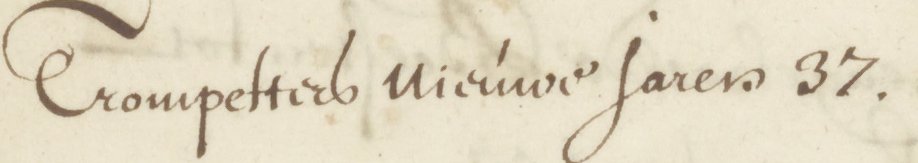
Trompetters nieuwe jaren 37.
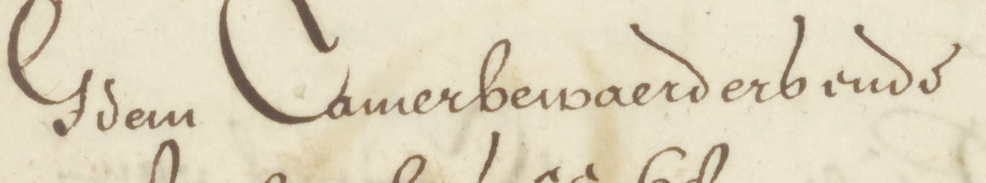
Idem Camerbewaerders ende
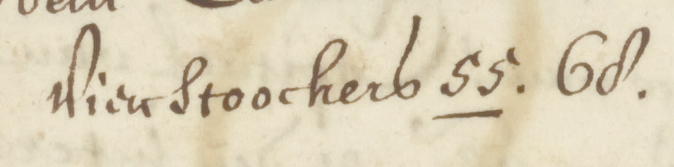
Vier Stoockers 55, 68.
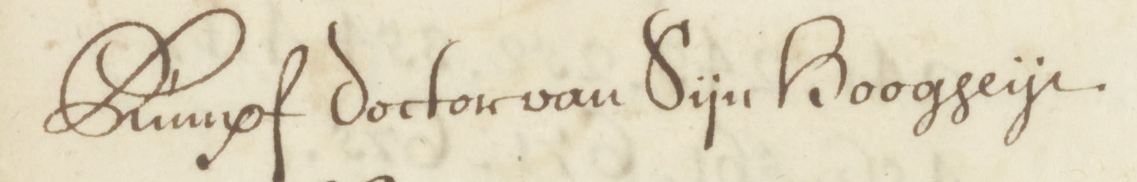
Rumpf doctor van Sijn Hoogheijt
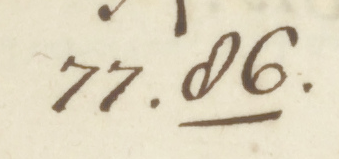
77, 86.
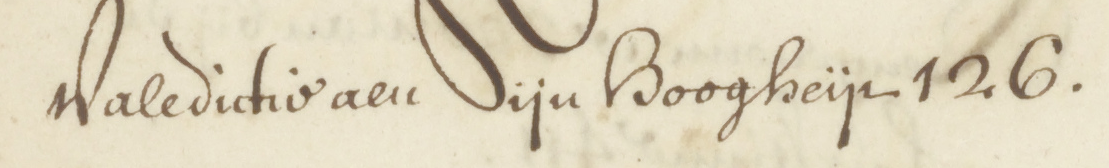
Valedictie aen Sijn Hoogheijt 126.
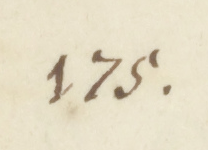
175.
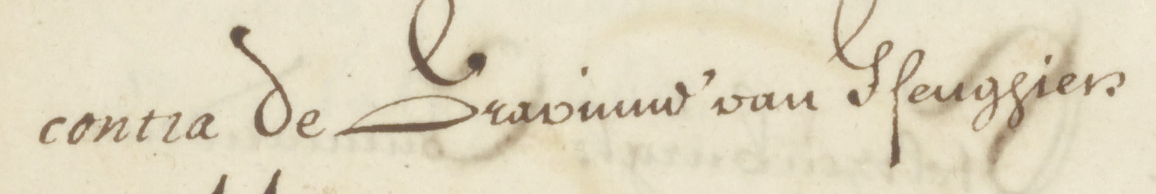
contra de Gravinne van Isenghien
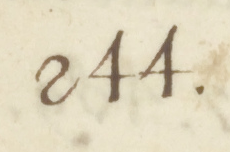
244.
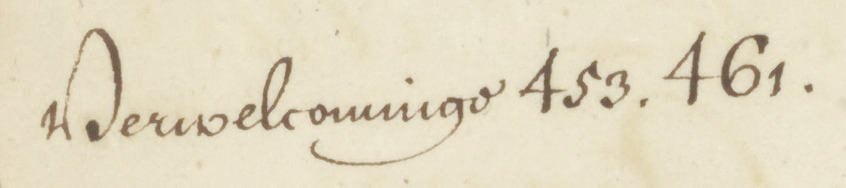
Verwelcominge 453, 461.
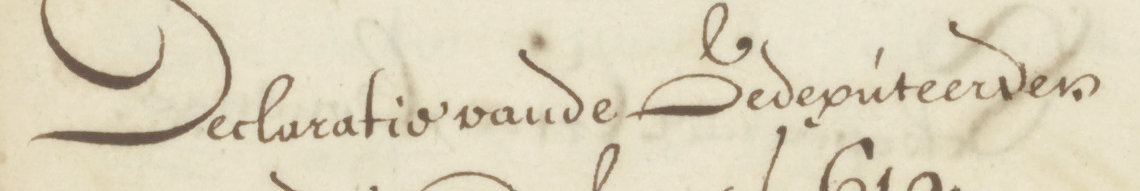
Declaratie vande Gedeputeerden
